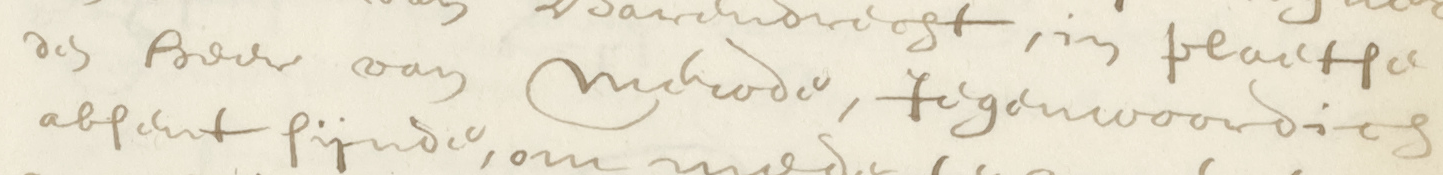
den heer van Merode, Jegenwoordich
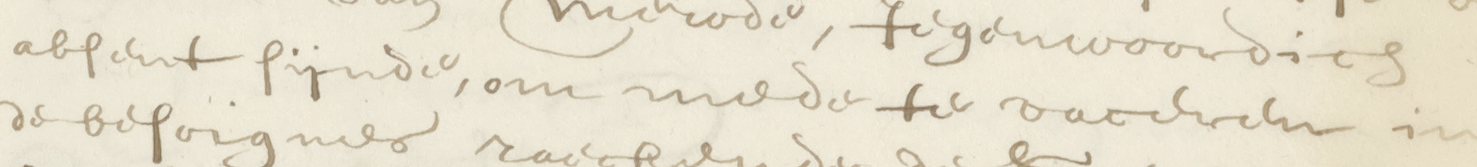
absent sijnde, om mede te vaceren in
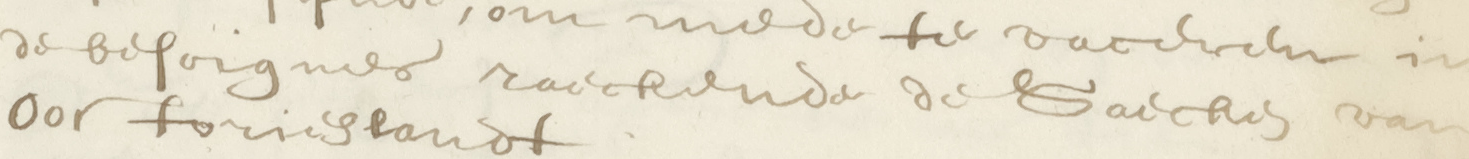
de besoignes raeckende de Saecken van
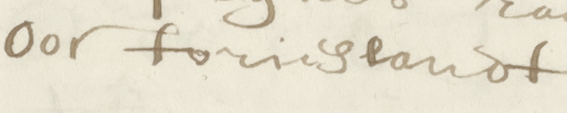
Oostvrieslandt.
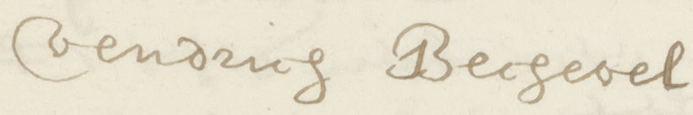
vendrich Bechevel.
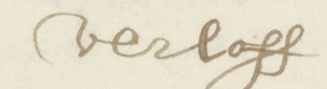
verloff.
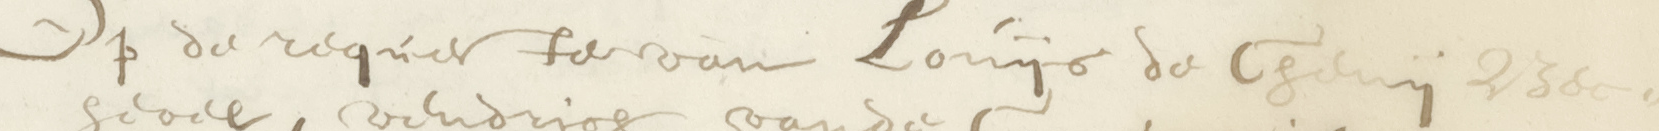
Op de requeste van Louijs de Chenij Bec„
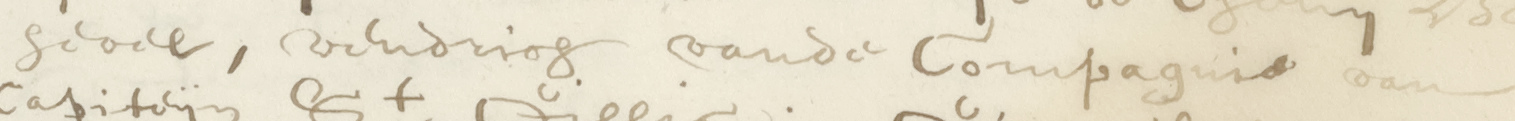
hevel, vendrich vande Compagnie van
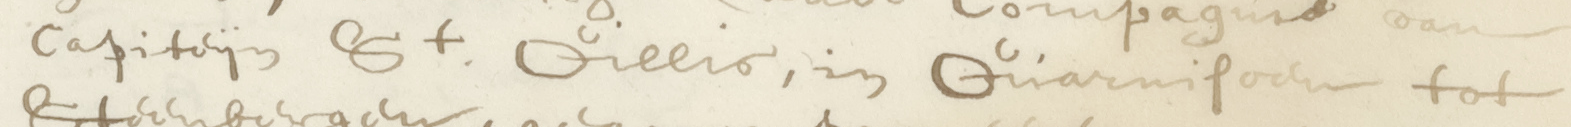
Capiteijn St. Gillis, in Guarnisoen tot
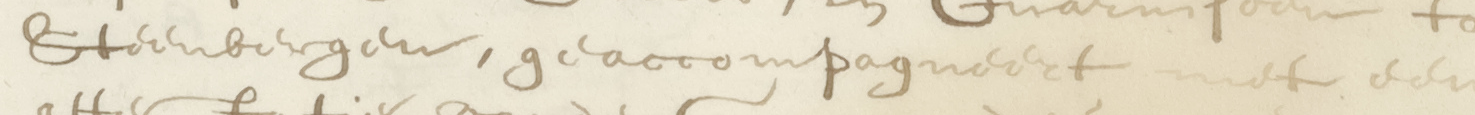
Steenbergen, geaccompagneert met een
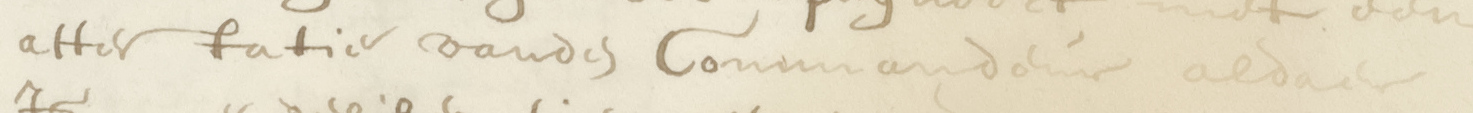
attestatie vanden Commandeur aldaer
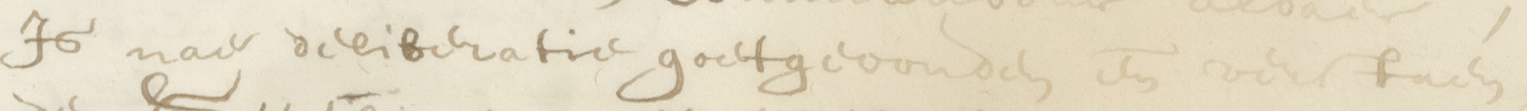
Is nae deliberatie goetgevonden en verstaen
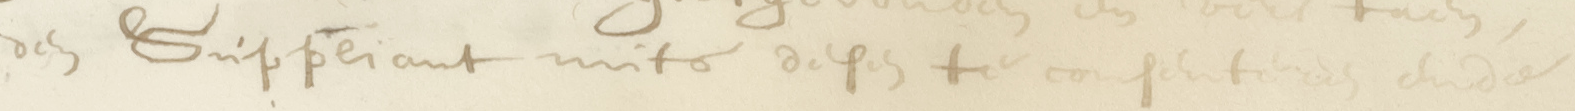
den Suppliant mits desen te consenteren ende
